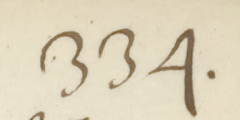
334.
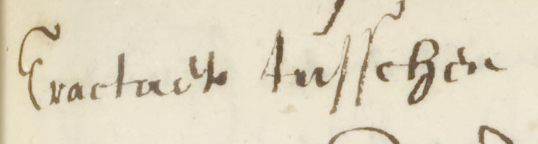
Tractaet tusschen
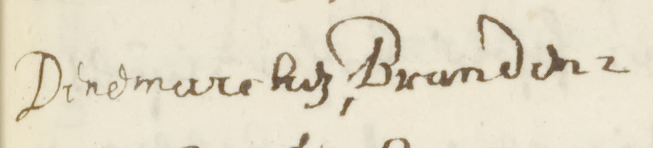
Denemarcken Branden=
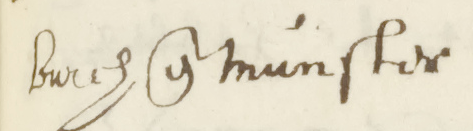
burch & munster
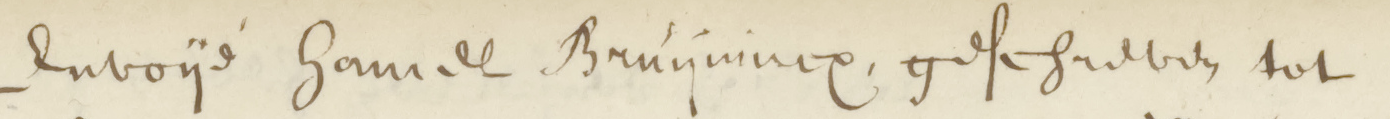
Envoijé Hamel Bruijnincx, geschreven tot
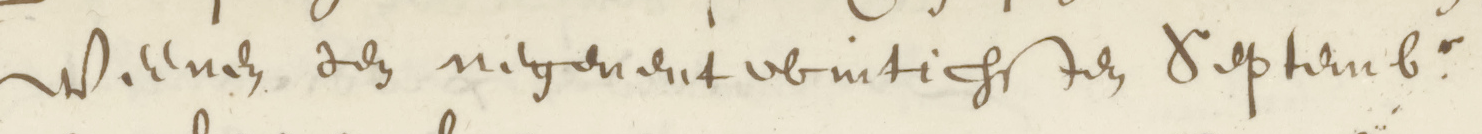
Weenen den negenentwintichsten Septembr.
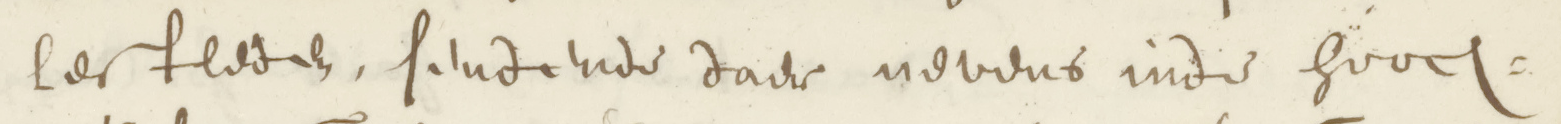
lestleden, sendende daer nevens inde hooch„
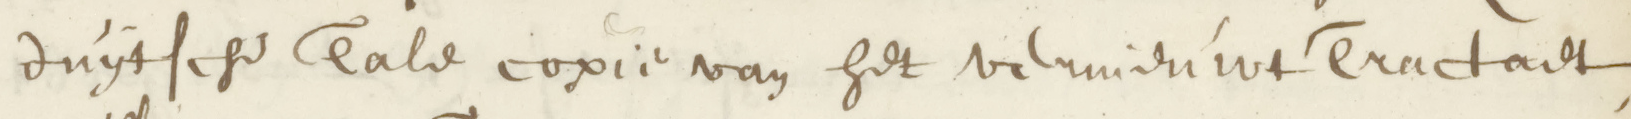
duijtsche Tale copie van het vernieuwt Tractaet
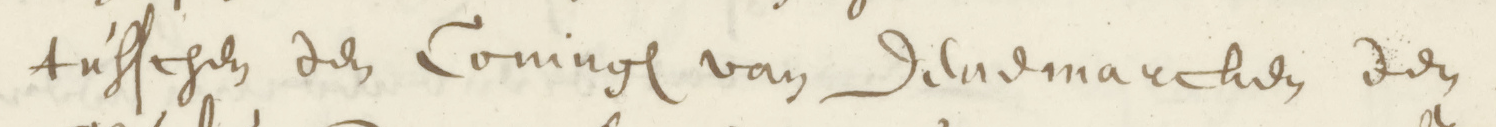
tusschen den Coningh van Denemarcken den
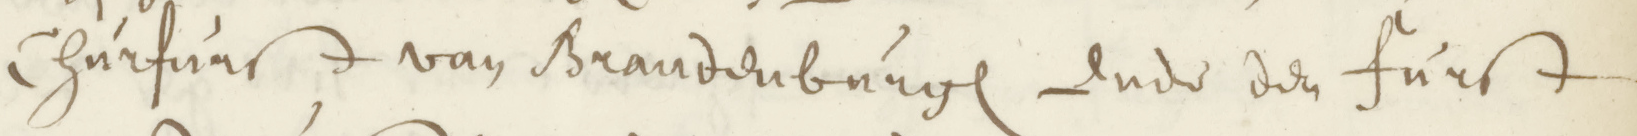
Churfurst van Brandenburgh ende den furst
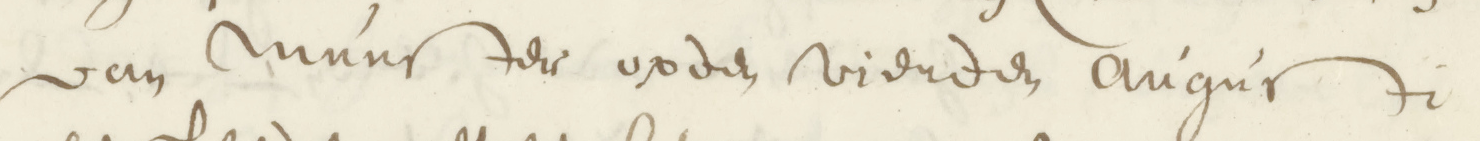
van Munster opden vierden augusti
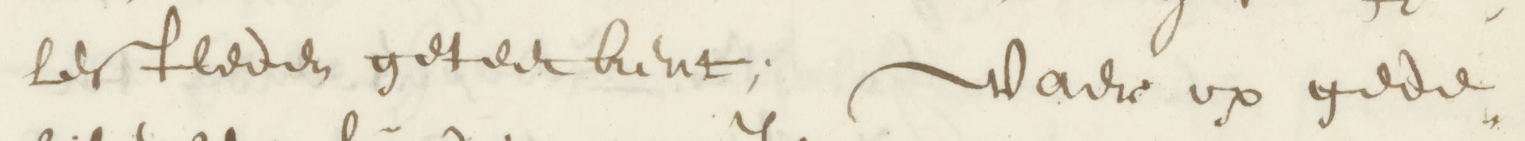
lestleden geteeckent; Waer op gede„
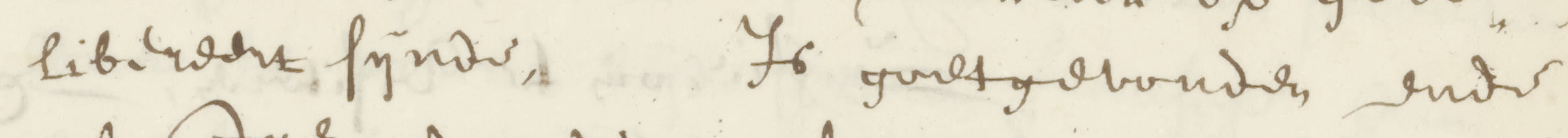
libereert sijnde, is goetgevonden ende
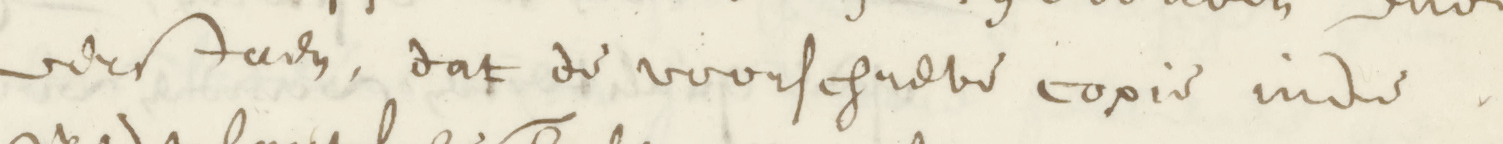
verstaen, dat de voorschreve copie inde
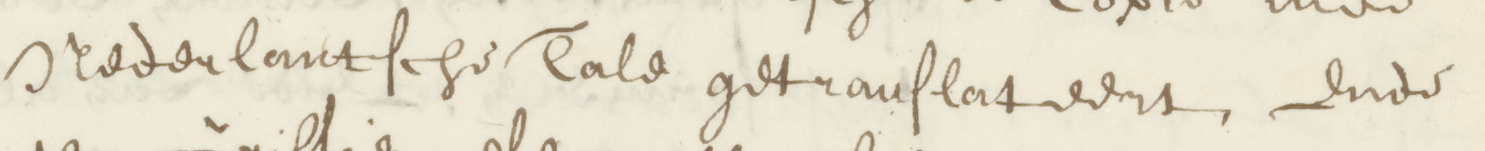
Nederlantsche Tale getranslateert, ende
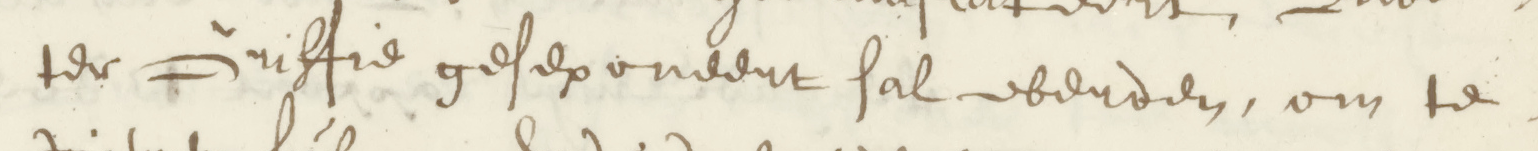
ter Griffie geseponeert sal werden, om te
